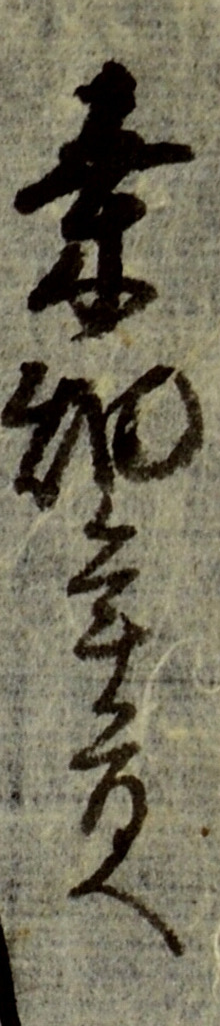桑畑年貢
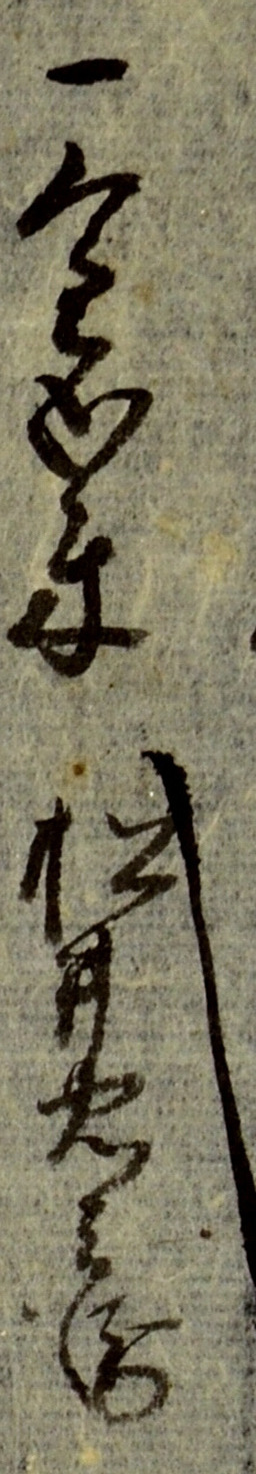一金弐朱松井忠兵衛
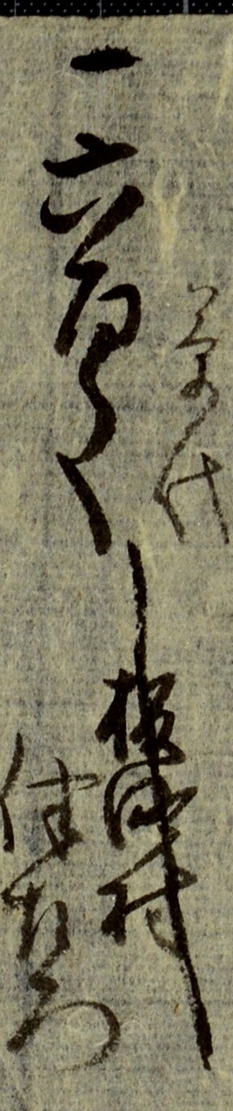一六百文板町村
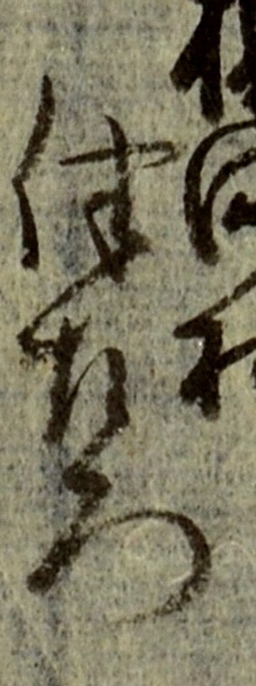伴左衛門
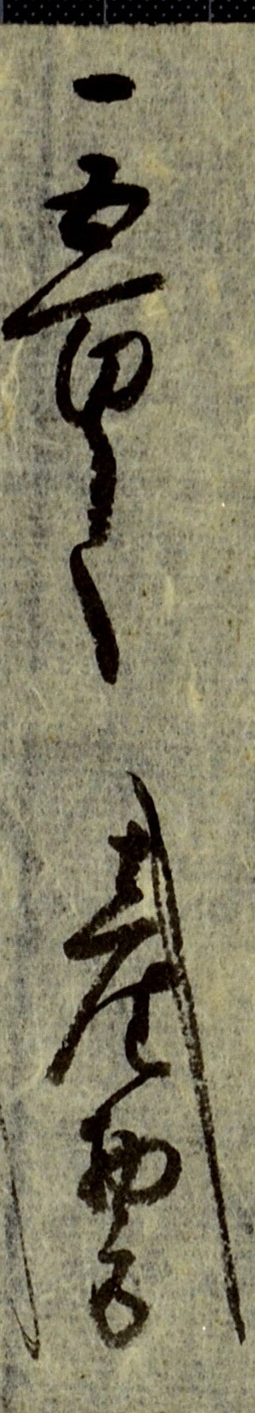一五百文産助方
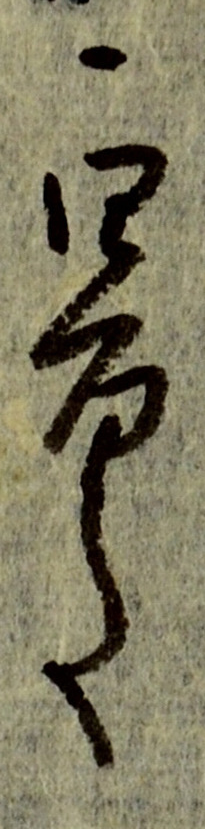〆四百文
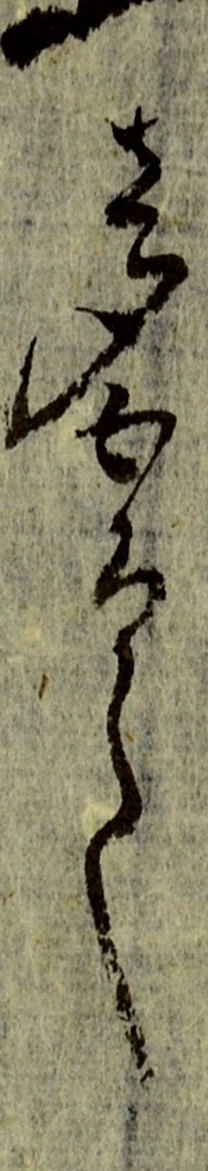壱〆五百文
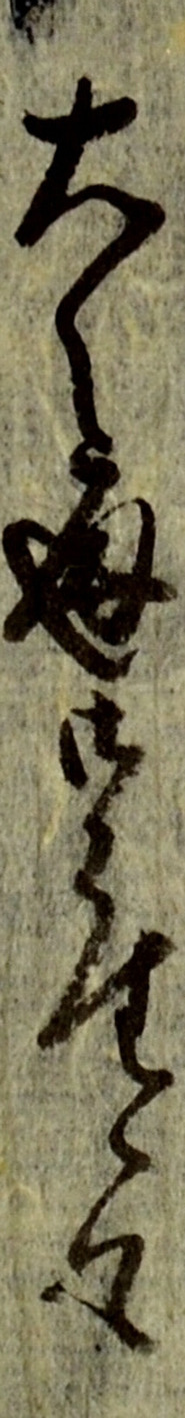右之通御座候以上
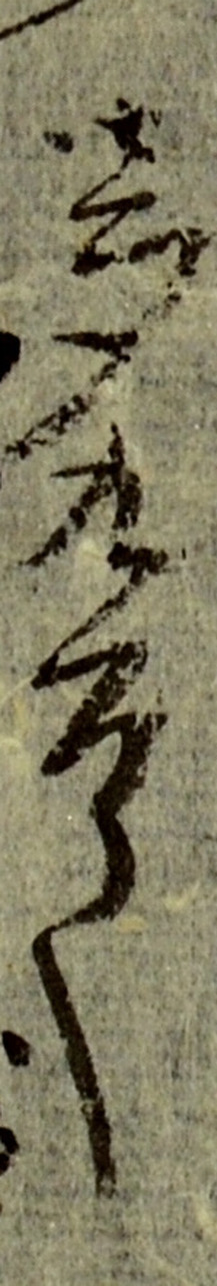壱〆九百文
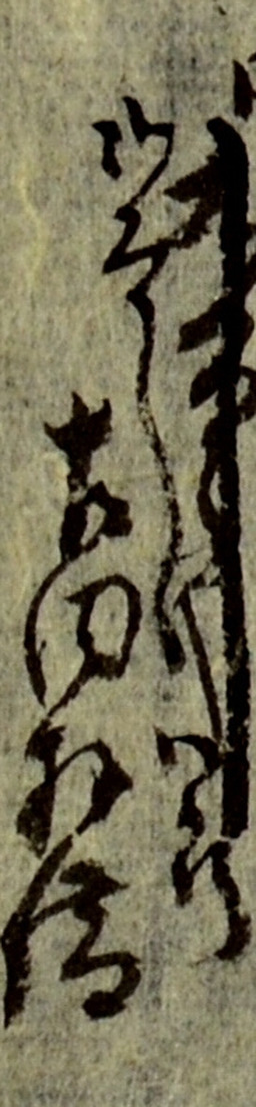古田拝借
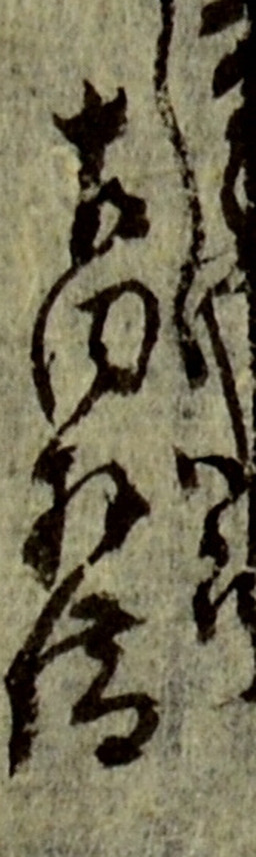古田拝借

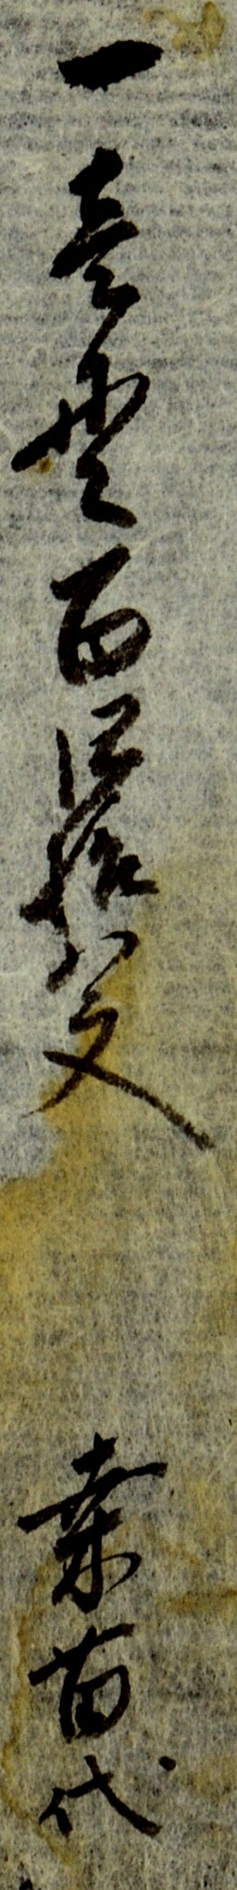一壱貫百四拾八文桑苗代
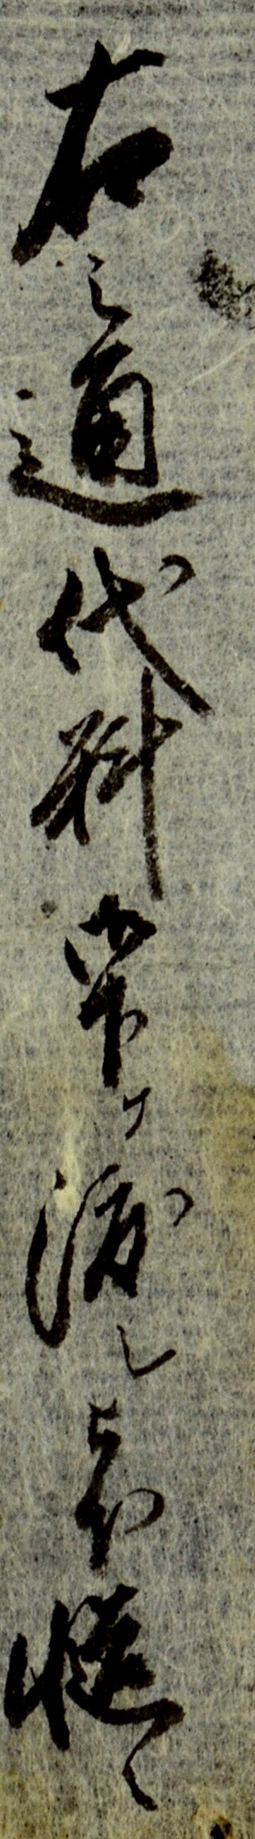右之通代料御下ヶ渡シ被下慥に
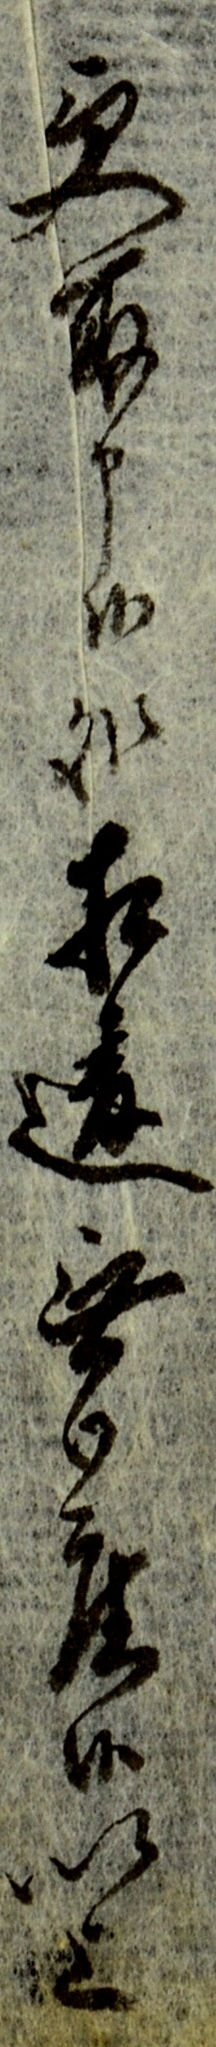受取申候処相違無御座候以上
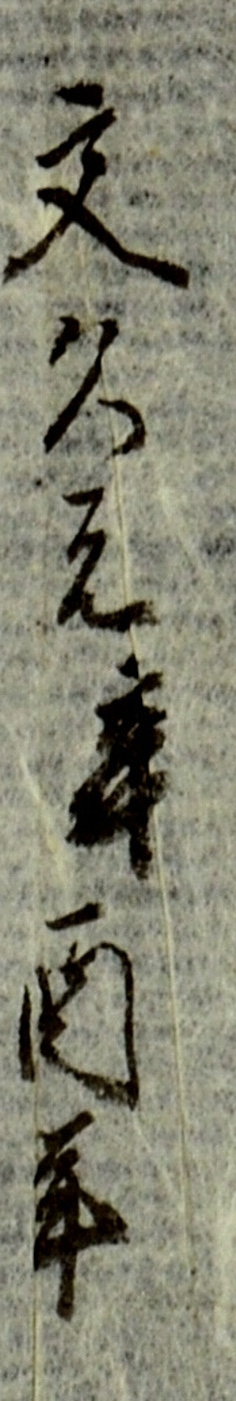文久元辛酉年
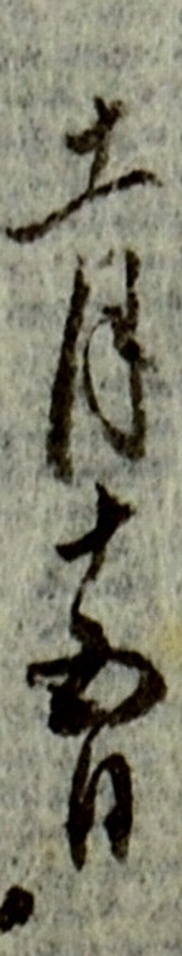十一月十五日
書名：覚
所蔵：伊那市立高遠町図書館・合同会社AMANE
